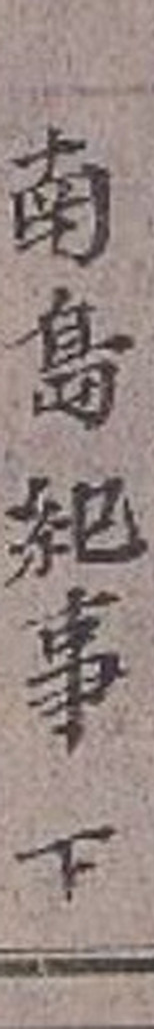南島紀事下

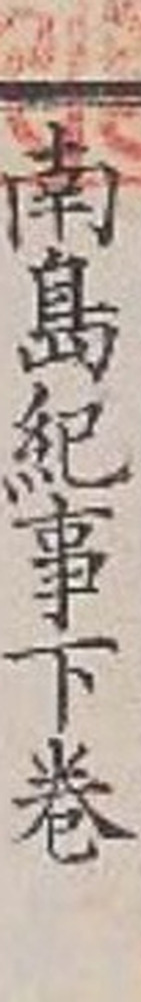南島紀事下巻
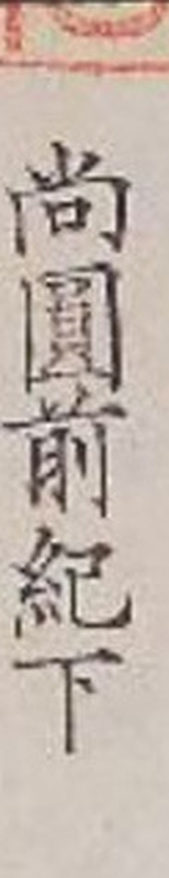尚円前紀下
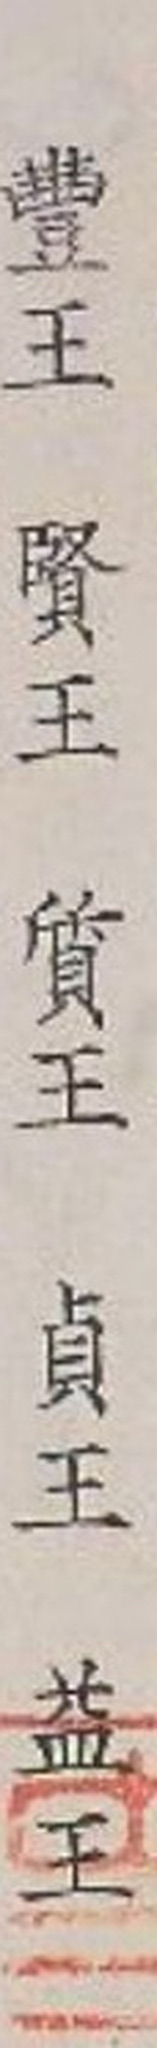豊王賢王質王貞王益王
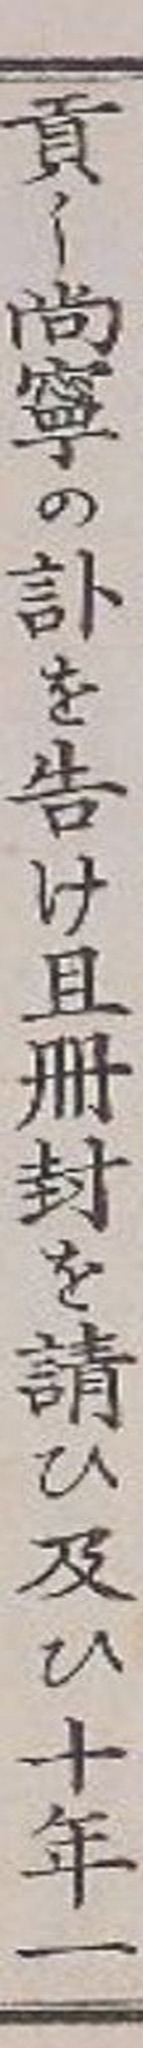貢し尚寧の訃を告け且冊封を請ひ及ひ十年一
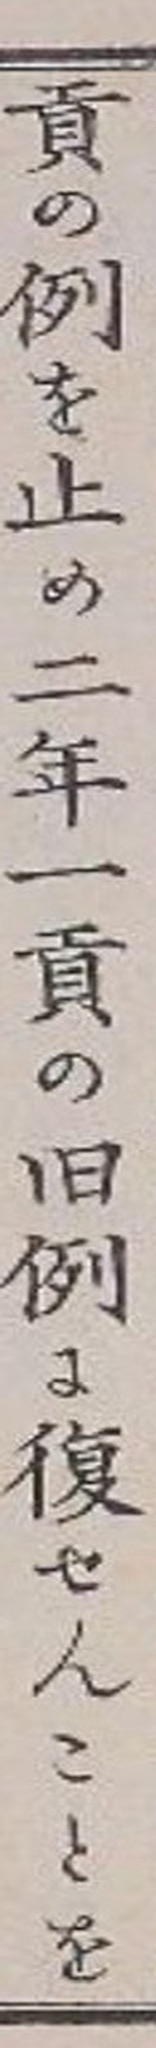貢の例を止め二年一貢の旧例に復せんことを
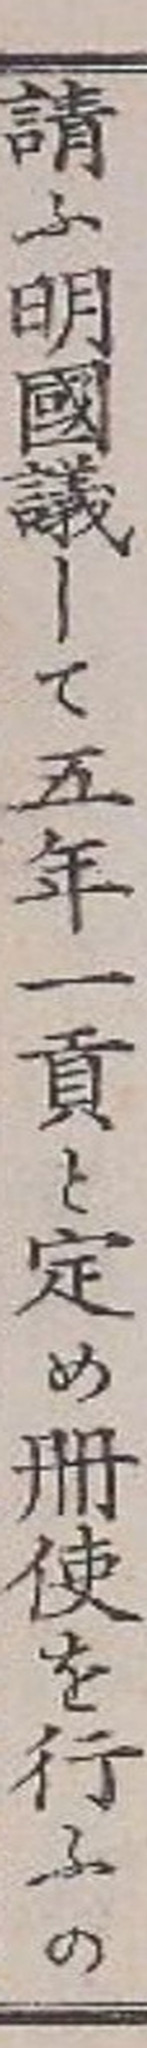請ふ明国議して五年一貢を定め冊使を行ふの

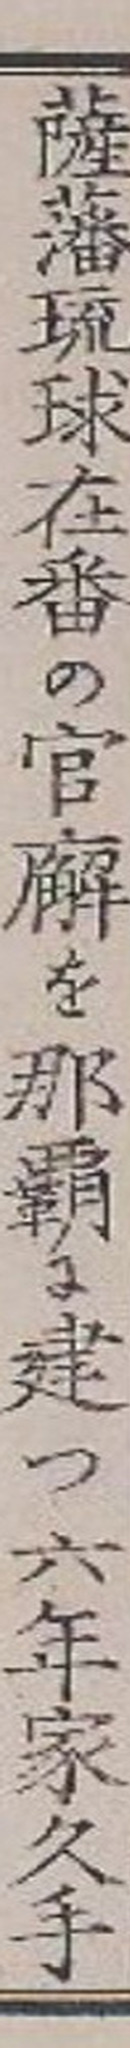薩藩琉球在番の官廨を那覇に建つ六年家久手
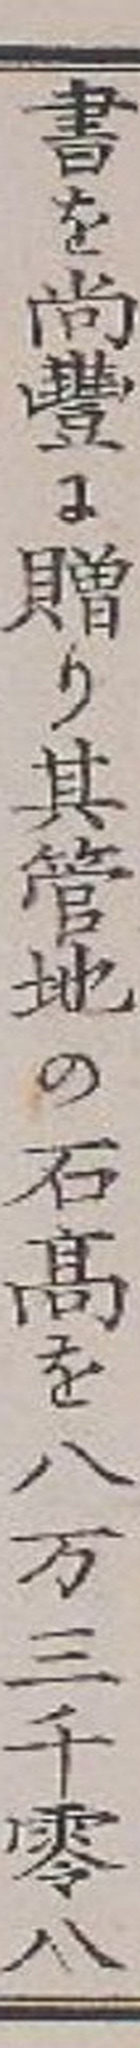書を尚豊に贈り其菅地の石高を八万三千零八
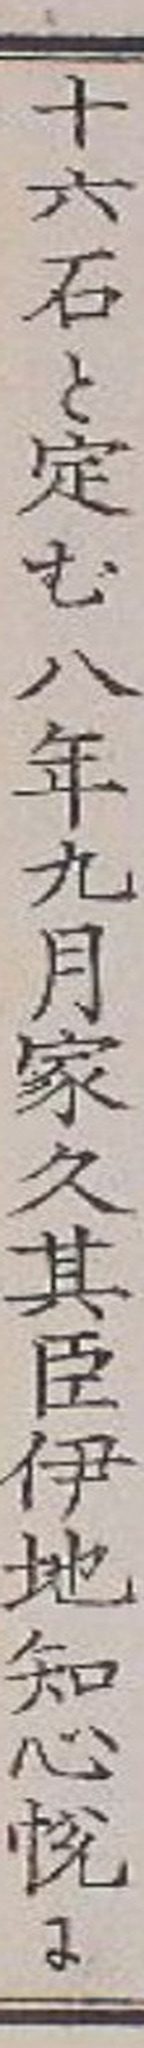十六石と定む八年九月家久其臣伊地知心悦に
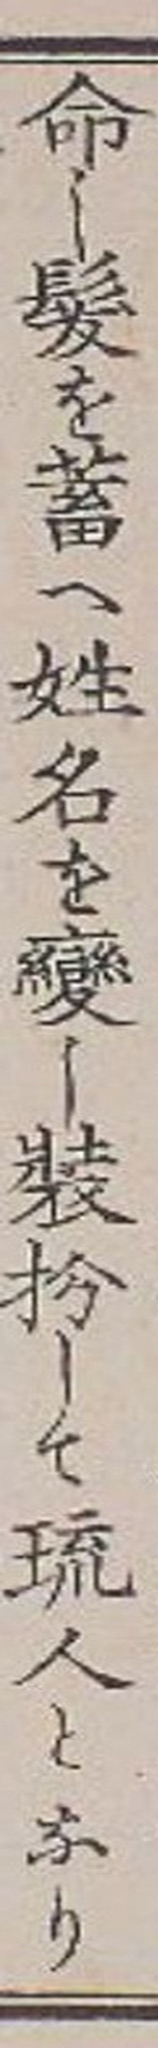命し髪を蓄へ姓名を変し装扮して琉人となり
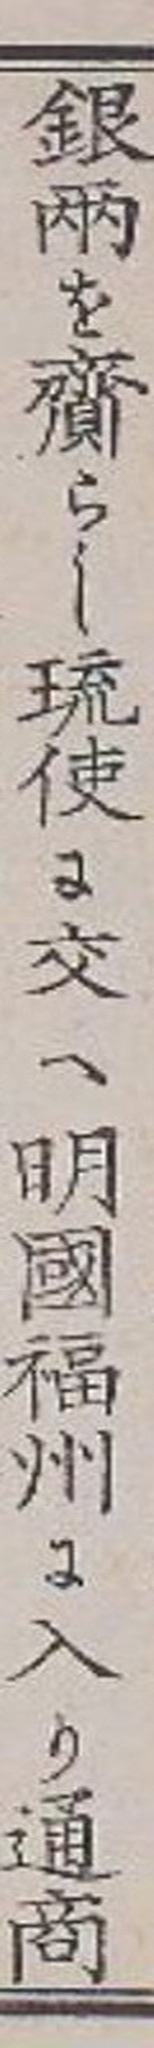銀両を齎らし琉使に交へ明国福州に入り通商
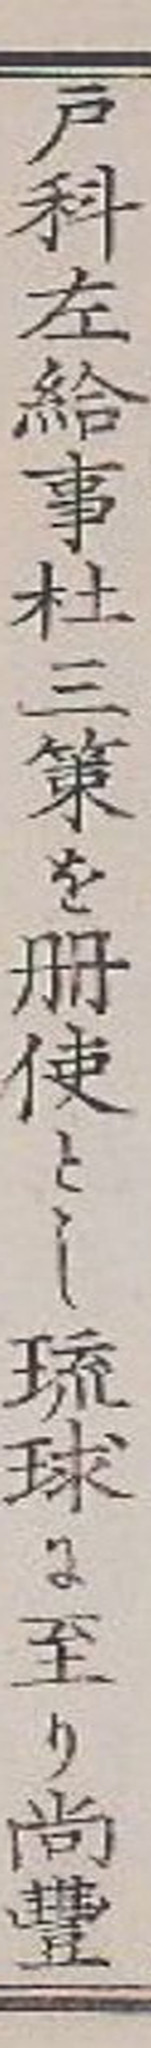戸科左給事杜三策を冊使とし琉球に至り尚豊
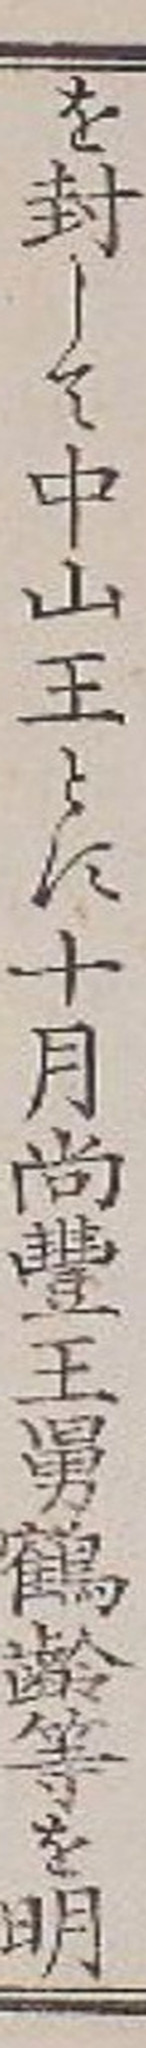を封して中山王とす十月尚豊王舅鶴齢等を明
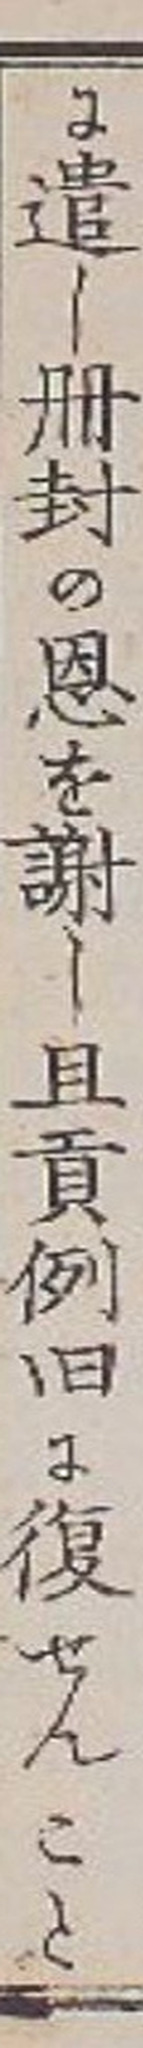に遣し冊封の恩を謝し且貢例旧に復せんこと
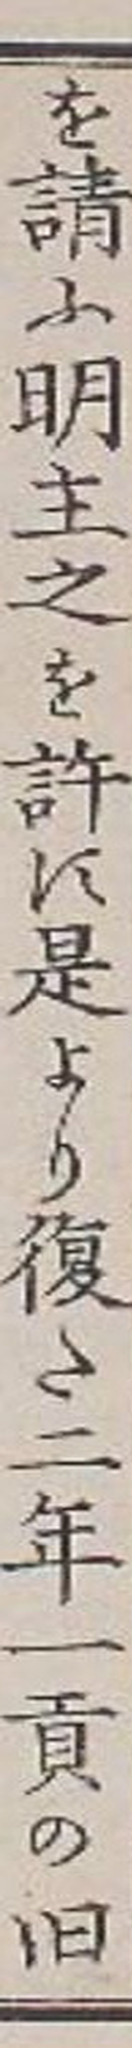を請ふ明主之を許す是より復た二年一貢の旧
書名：南島紀事 下
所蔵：University of the Ryukyus Library
